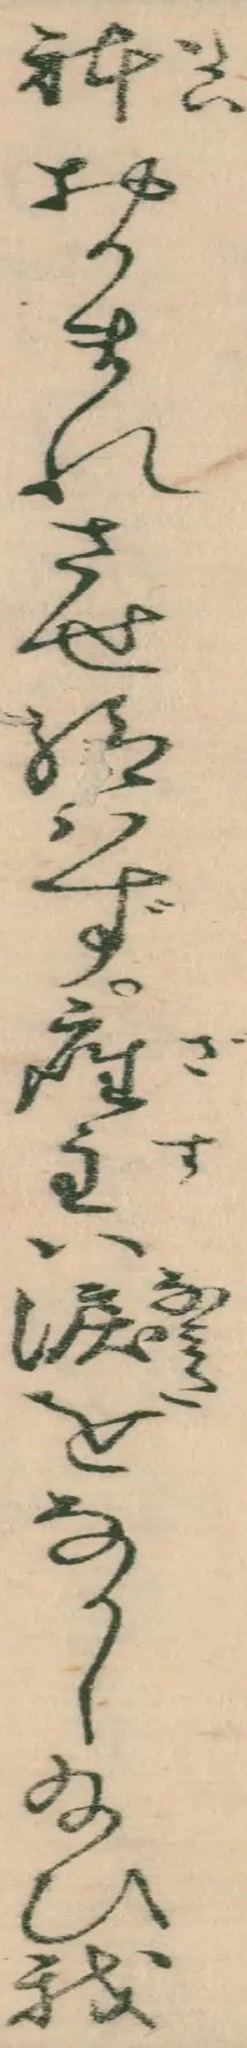体おかまれさせ給はず。座主は涙をなかし給ひ我
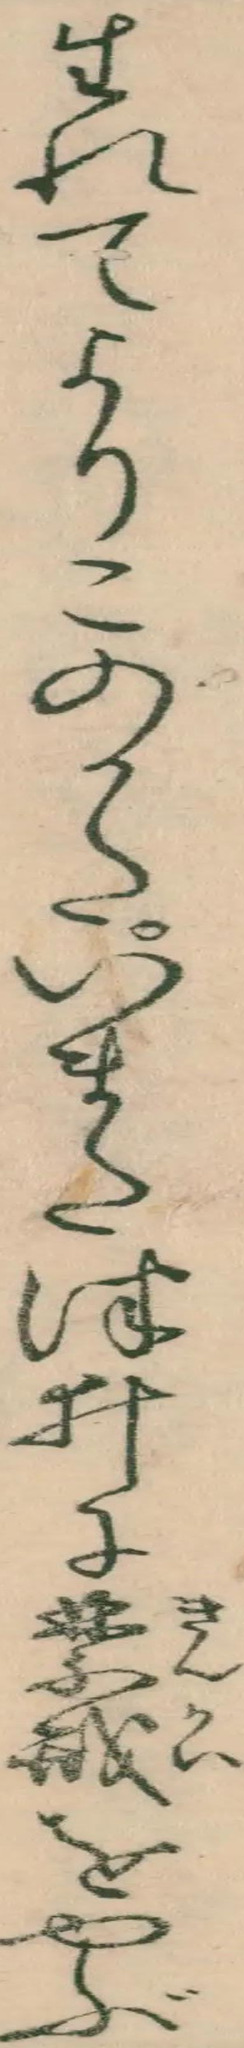生れてよりこのかた。いまたつゐに禁戒をやぶ
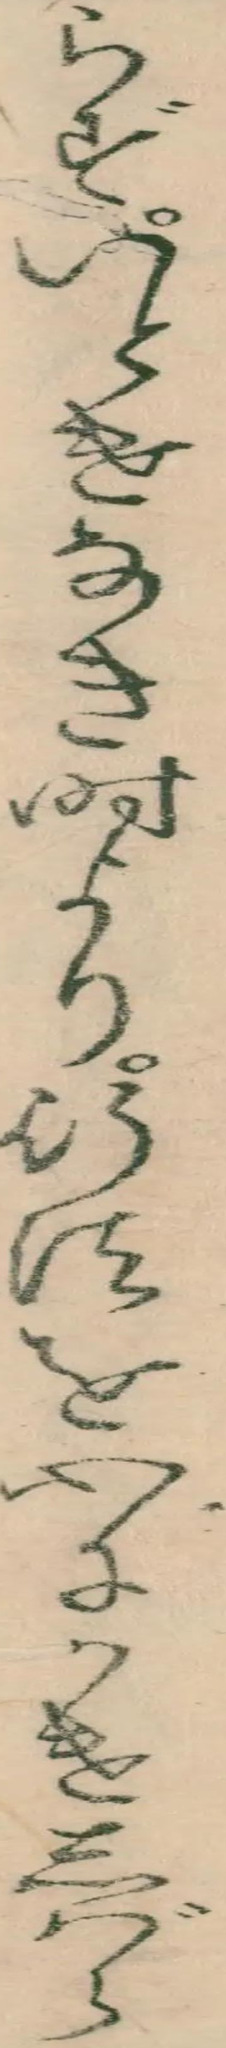らず。いとけなき時より。行法を心にかけしばら
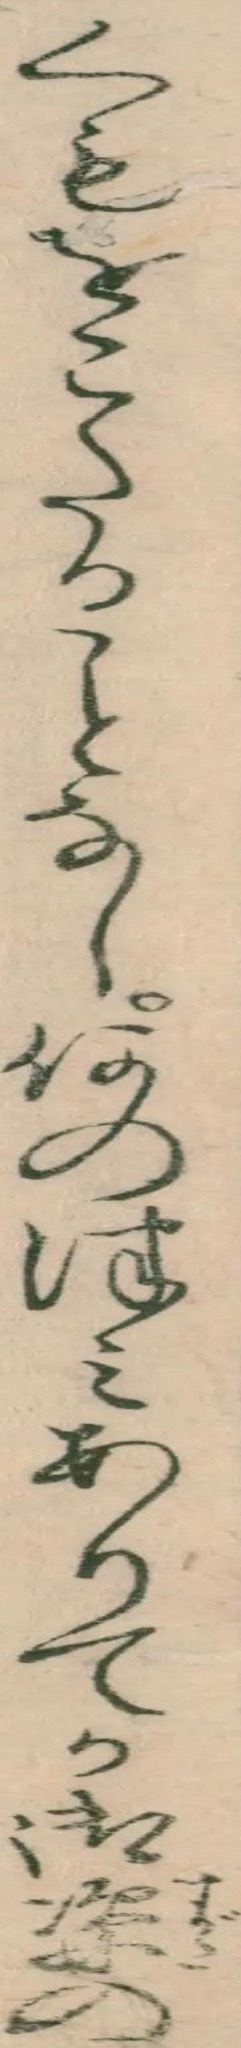くもをこたることなし。何のつみありてか御姿の
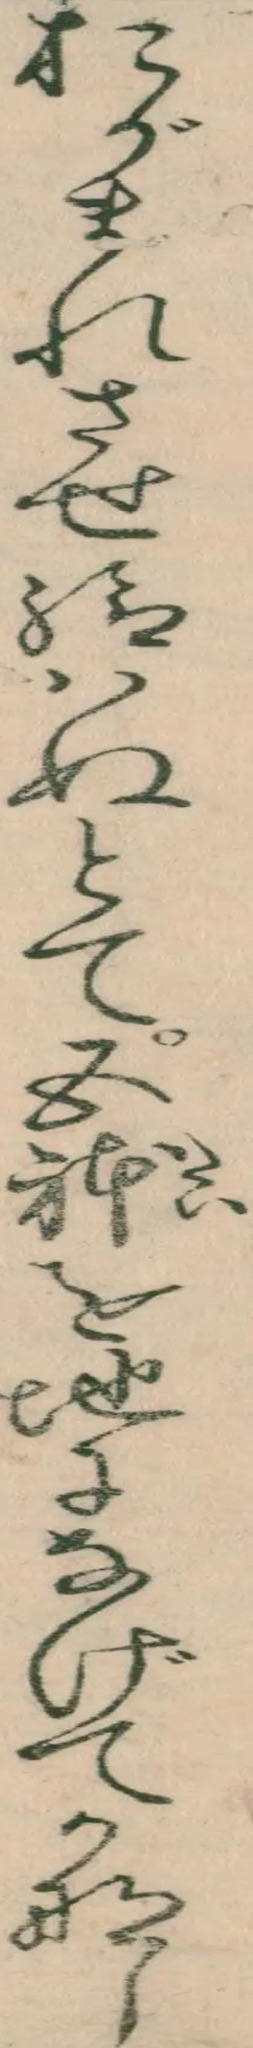おがまれさせ給はぬとて。五体を地になげてかなし
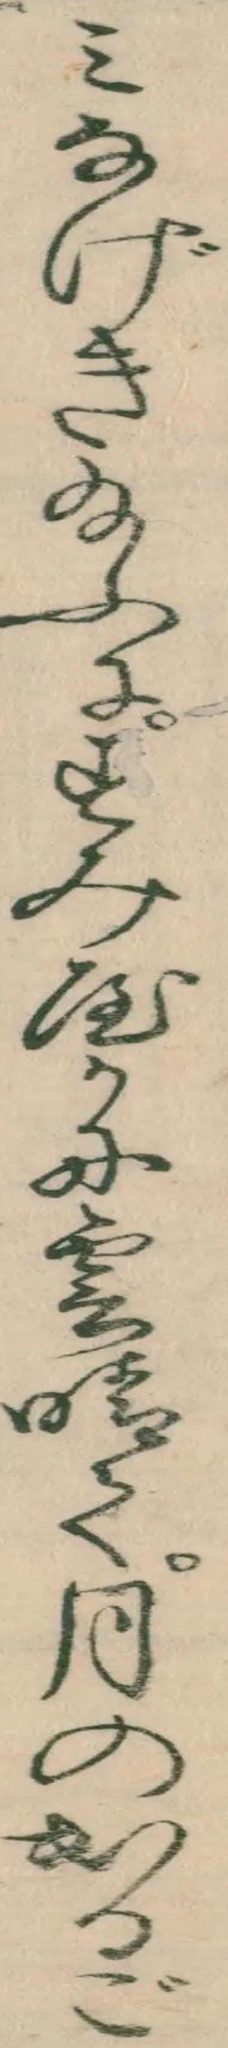みなげき給ふに。すみやかに雲晴て。月の出るご
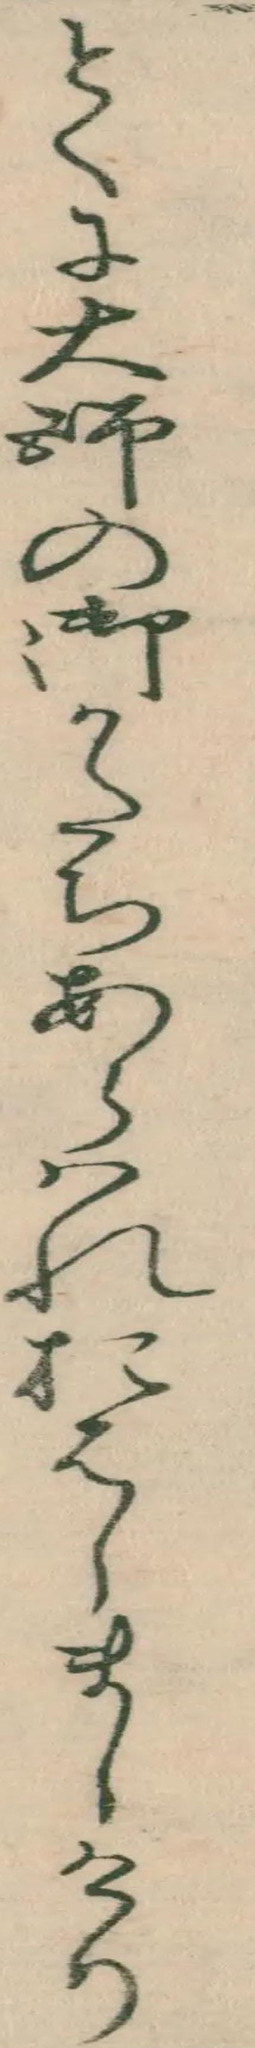とくに大師の御かたちあらはれおはしましけり
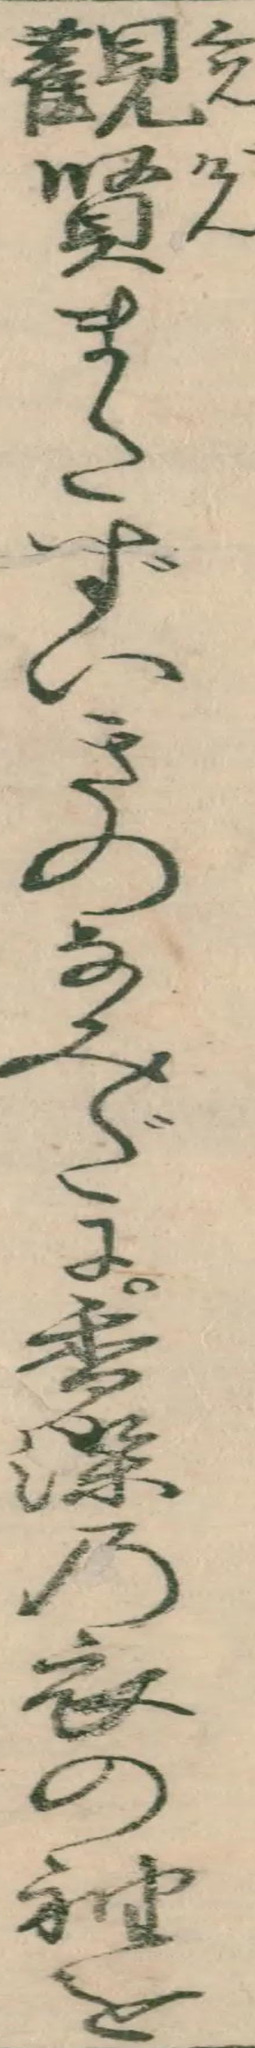観賢またずいきのなみだに香染の衣の袖を
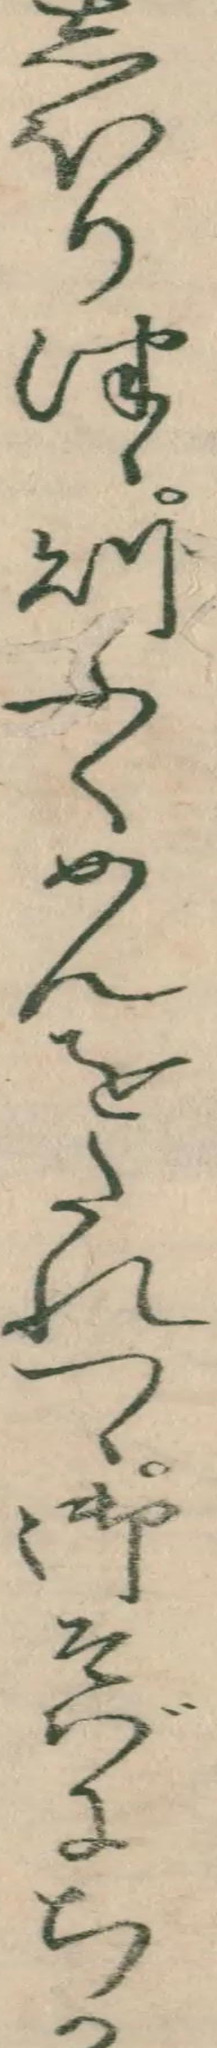しほりつゝ。則ふくめんをされつゝ。御そばにちか
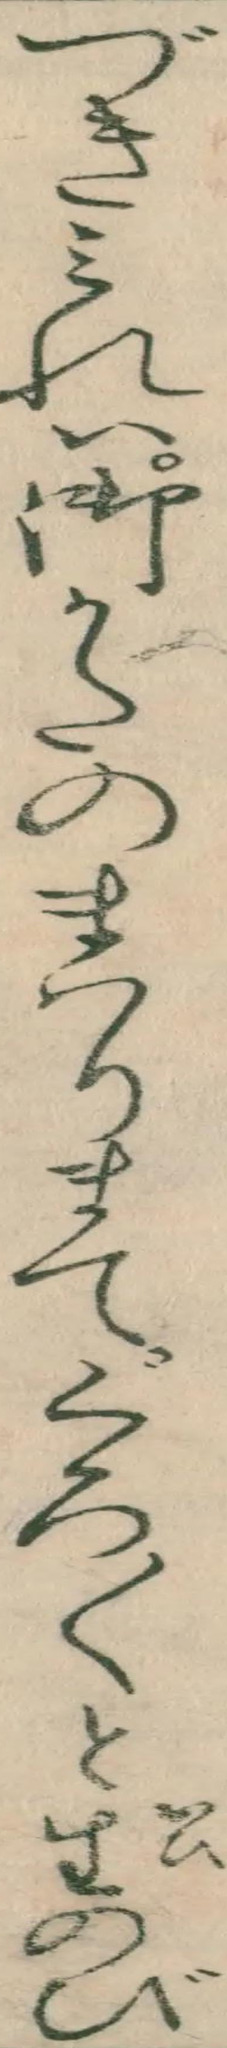づきみれは。御かたのまはりまて。くろ〳〵と生のび
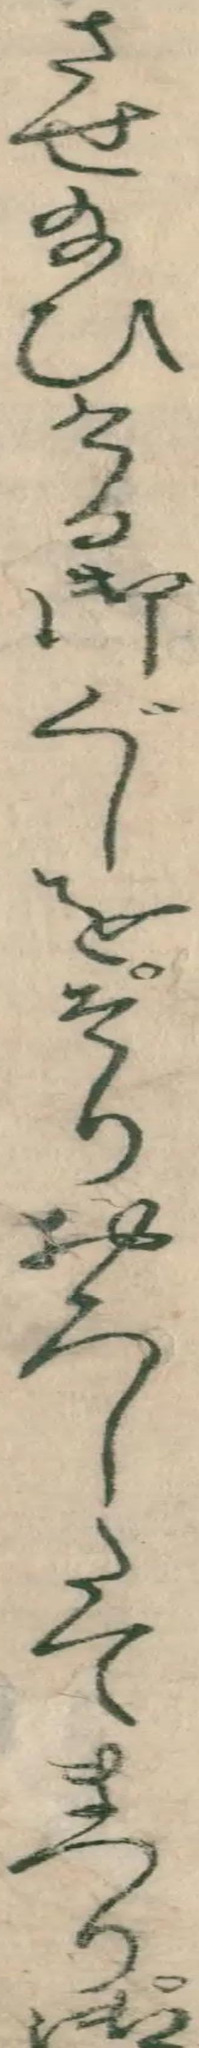させ給ひける御ぐしを。そりおろしたてまつり。御
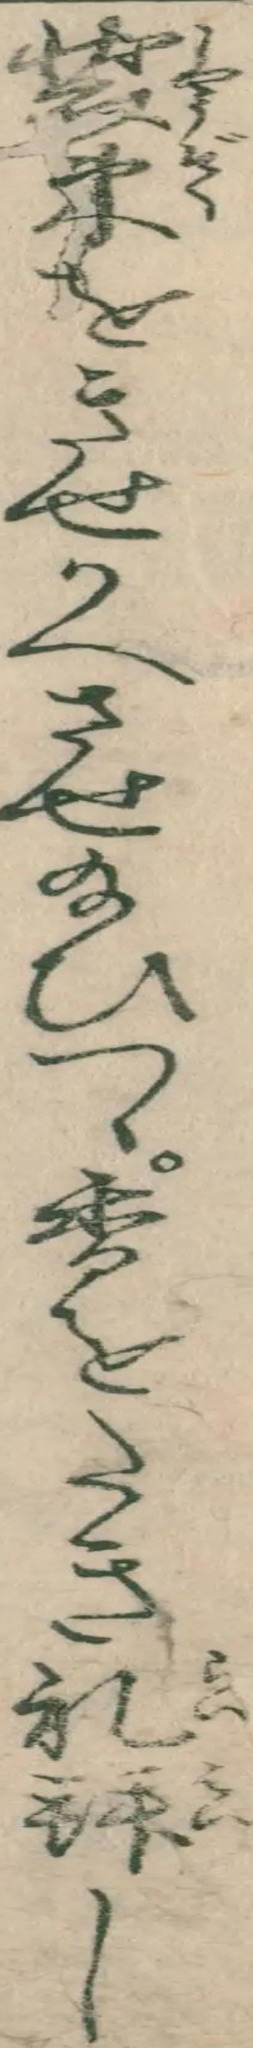装束をきせかへさせ給ひつゝ。香をたき礼拝し
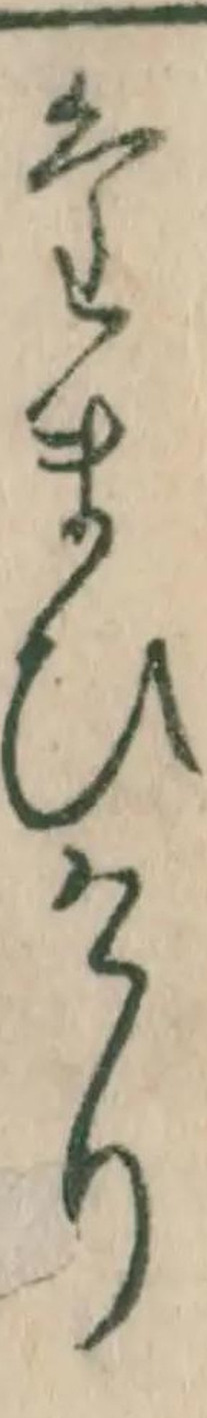たまひけり

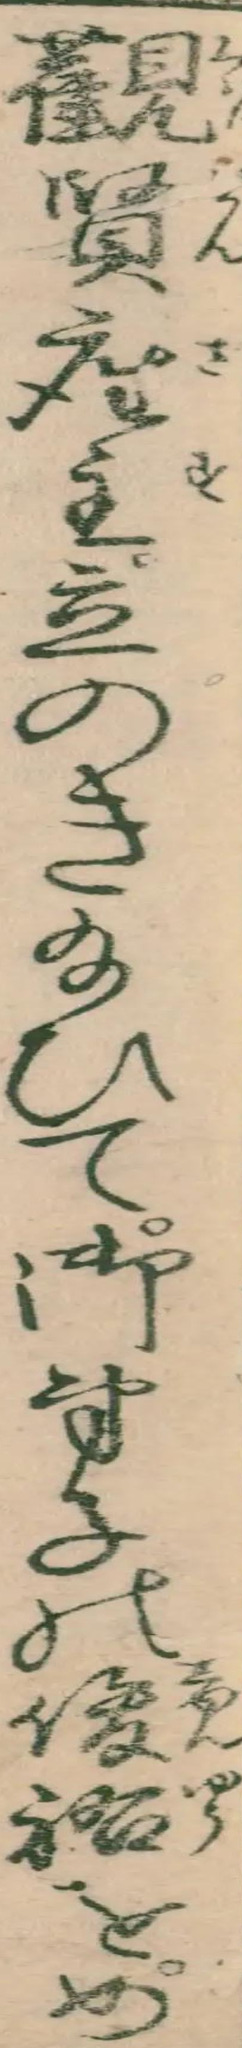観賢座主。立のき給ひて。御弟子の俊祐をめ
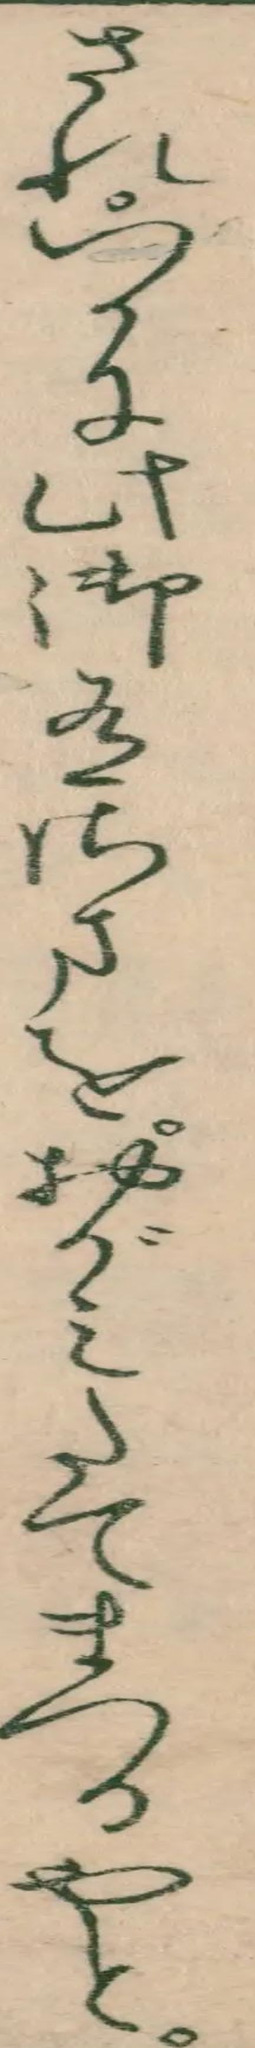され。いかに此御有さまを。おがみたてまつるやと。
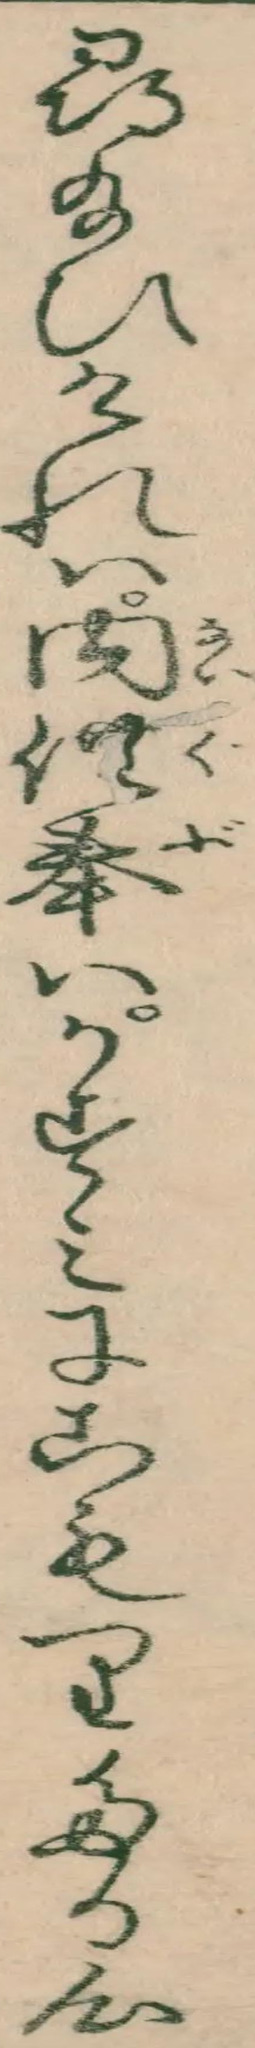尋給ひけれは。内供奉は。かすみにこもりたる心
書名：弘法大師御本地 3巻. [3]
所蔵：国立国会図書館 National Diet Library, JAPAN
